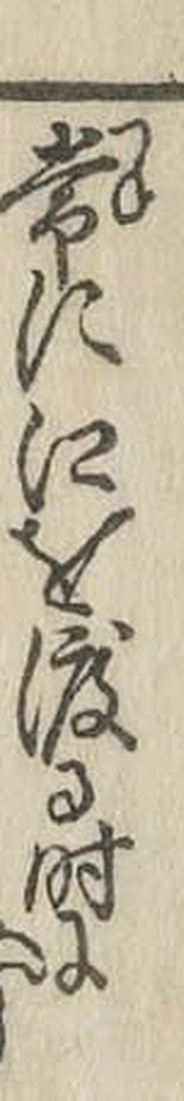常に江を渡る時に
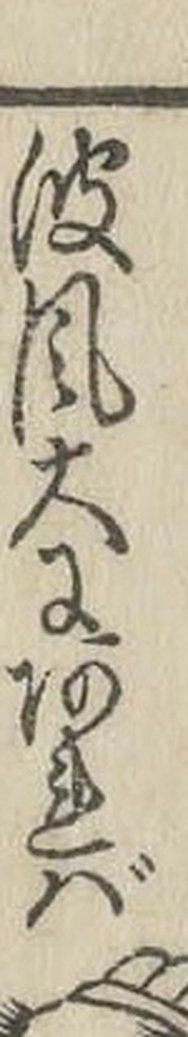波風大にあれば
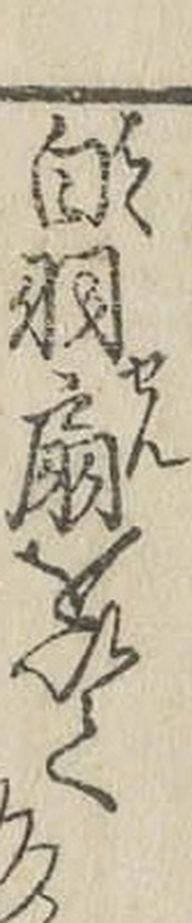白羽扇を以て
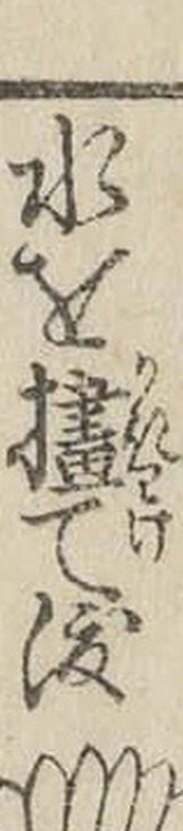水を㩇て渡
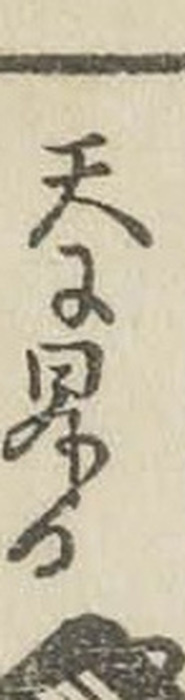天に昇る
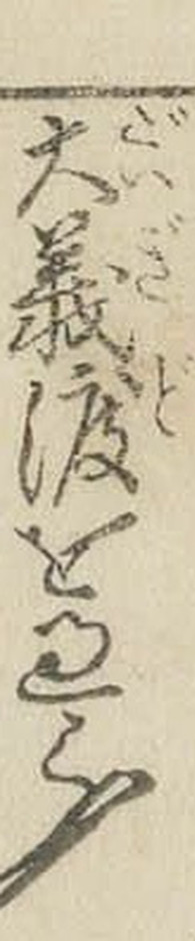大義渡を過て
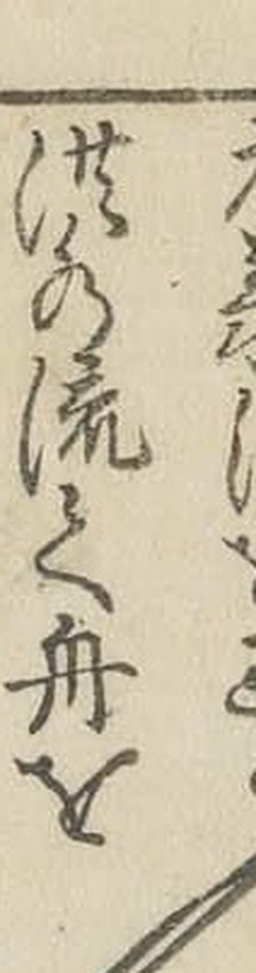洪水流て舟を
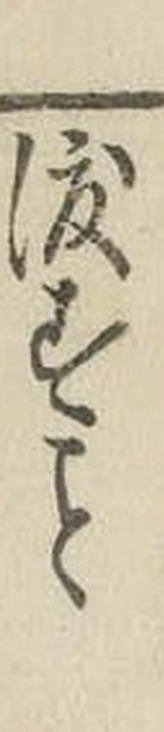渡すこと
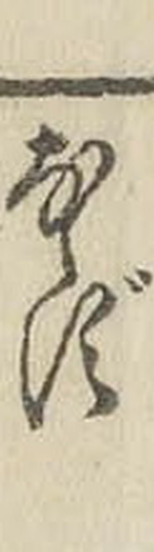ならず
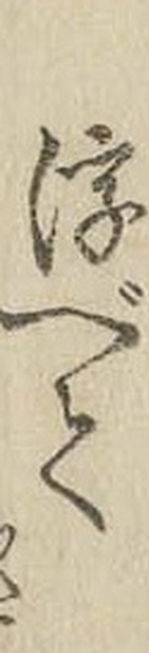浮べて

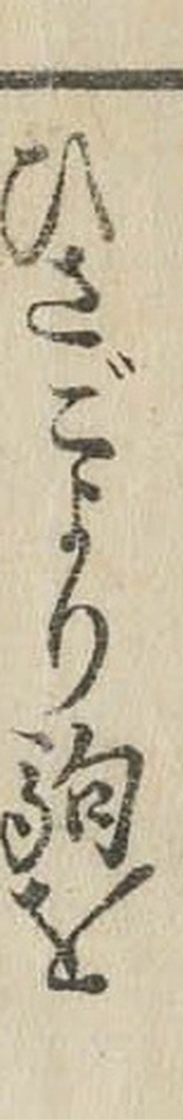ひさごより駒を
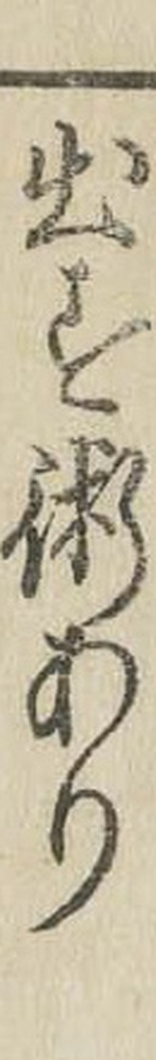出す術あり
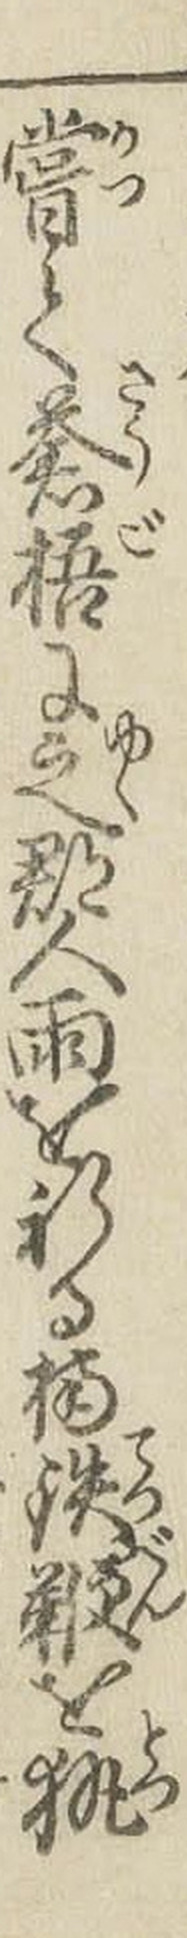嘗て蒼梧に之郡人雨を祈る楠鉄鞭を執
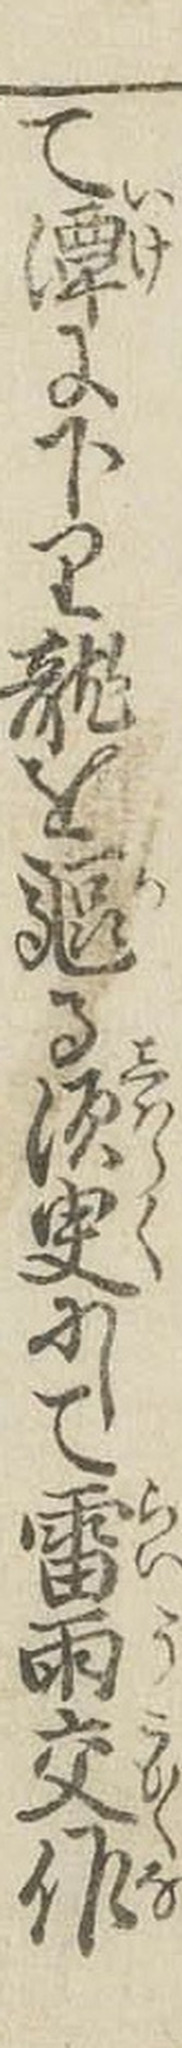て潭に下り竜を駆る須臾にして雷雨交作
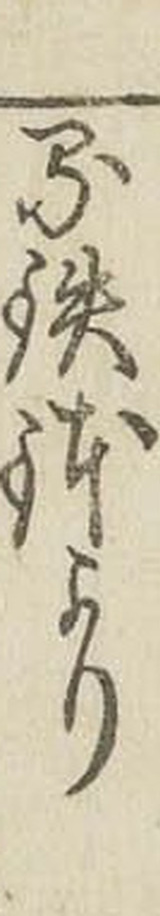る鉄鉢より
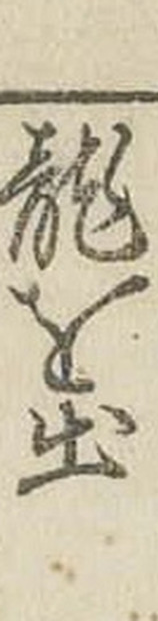竜を出
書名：絵本写宝袋 9巻 7之巻
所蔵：東京学芸大学教育コンテンツアーカイブ
